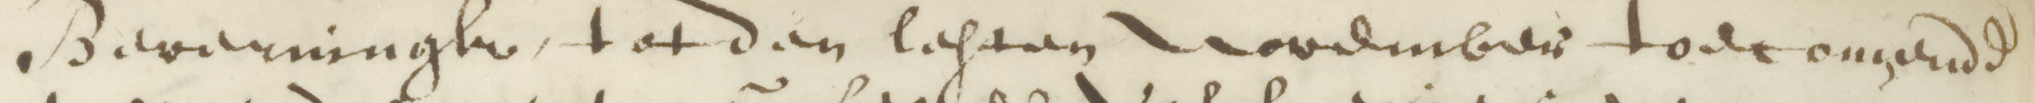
Beverningk, tot den lesten November toecomende
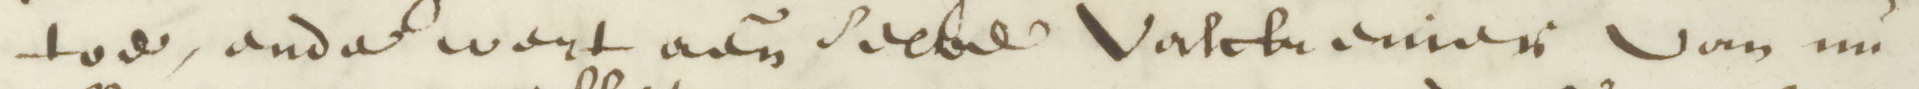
toe, ende wert aen selve Valckenier van nu
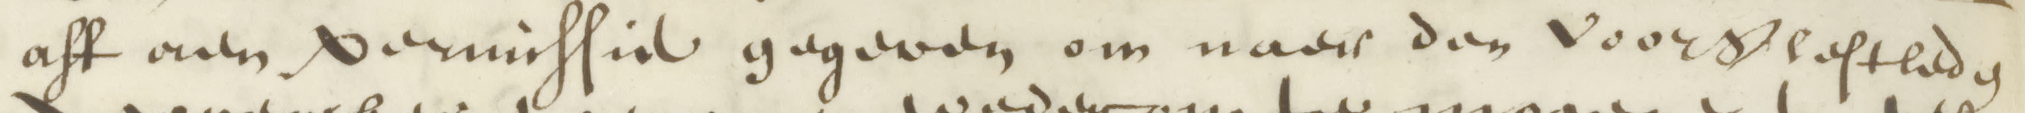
aff aen permissie gegeven om naer den voors lestleden
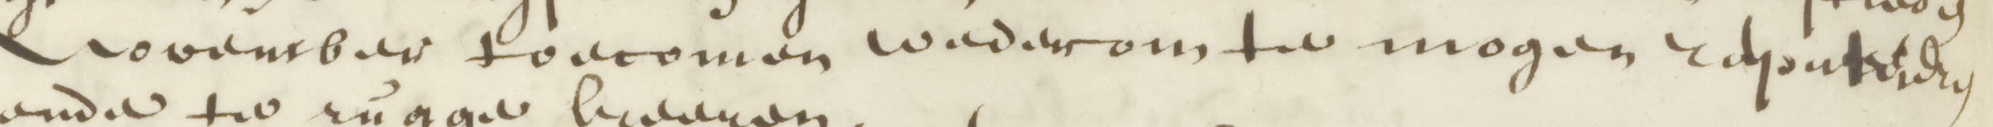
November toecomen wederom te mogen reputeren
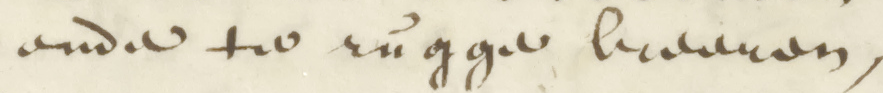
ende te rugge keeren.
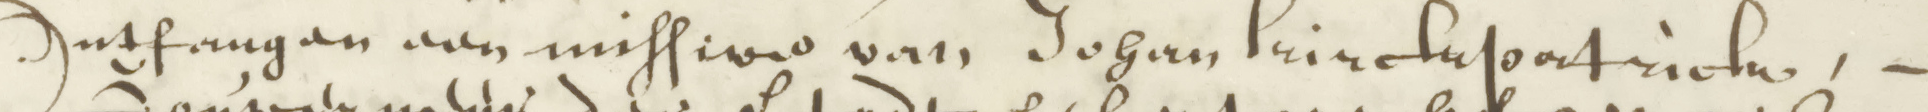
Ontfangen een missive van Johan kirckpatrick, -
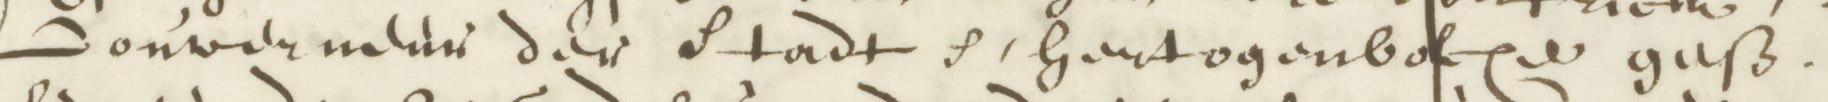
Gouverneur der stadt s'hertogenbosche ges.
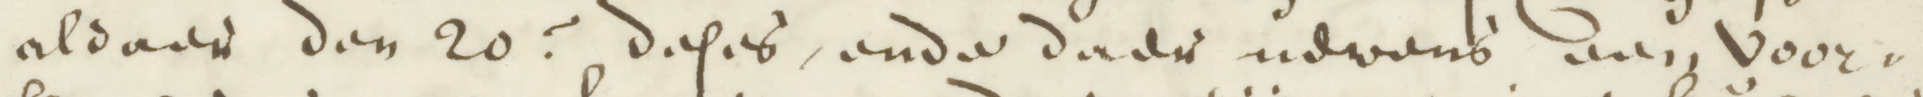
aldaer den 20e. deses, ende daer nevens een voor„
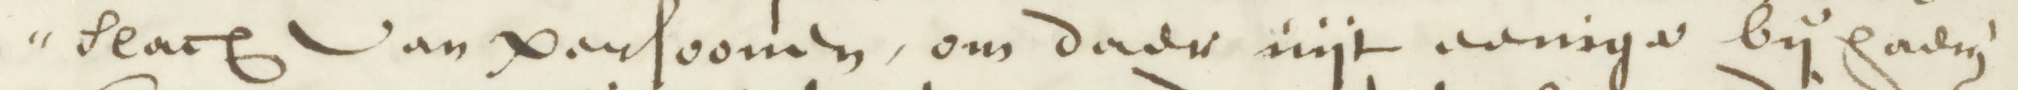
,,slach van persoonen, om daer uijt eenige bij hare
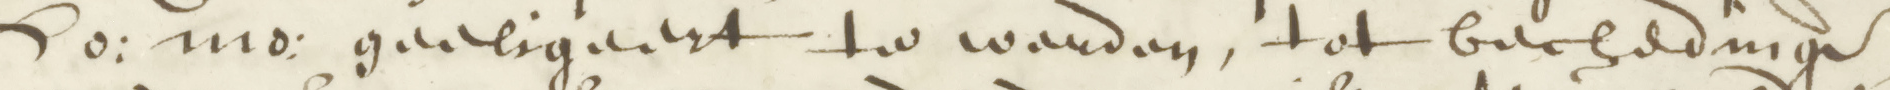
Ho:Mo: geeligeert te werden, tot becledinge
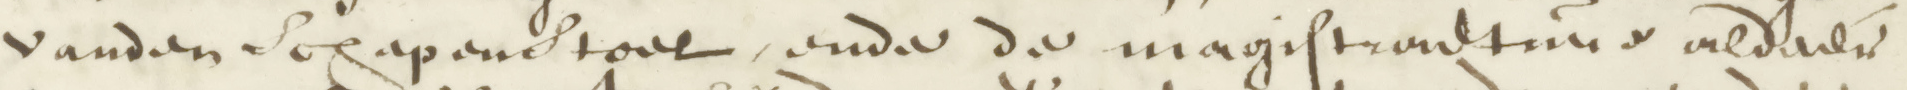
vanden Schepenstoel, ende de magistraeture aldaer
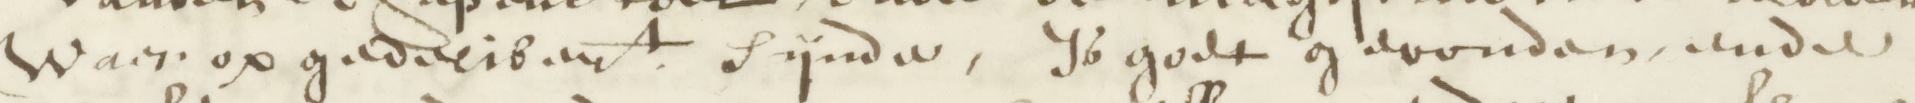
Waerop gedelibert sijnde, is goet gevonden, ende
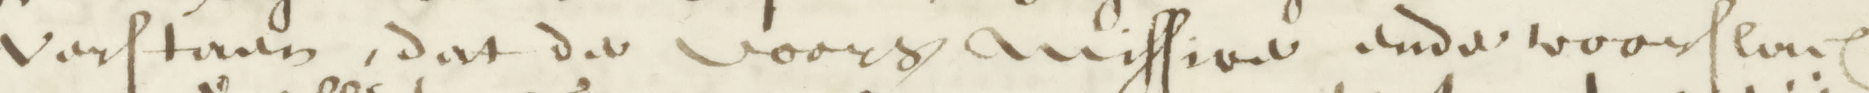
verstaen, dat de voors missive ende voorslach
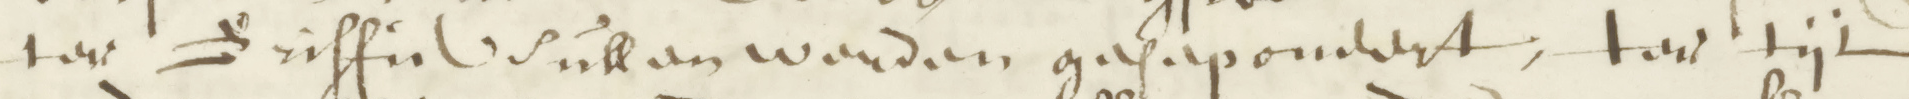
ter Griffie sullen werden geseponeert, ter tijt
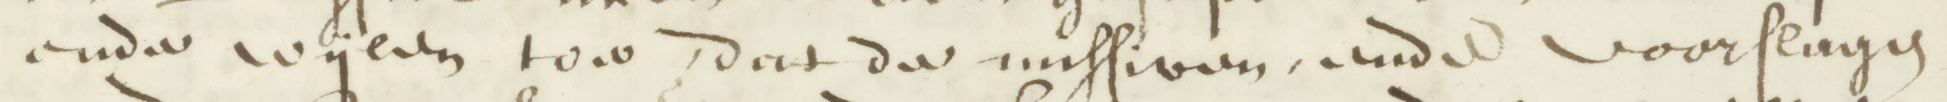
ende wijlen toe, dat de missiven, ende voorslagen
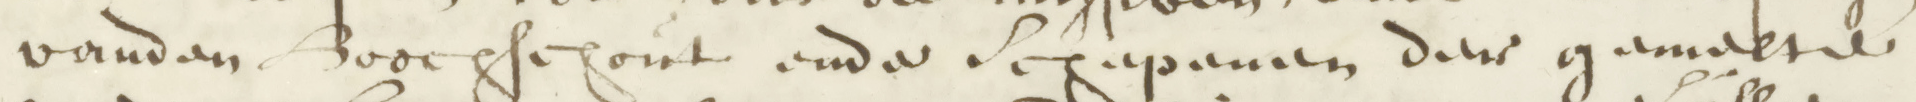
vanden hoochschout ende schepenen der gemelte
